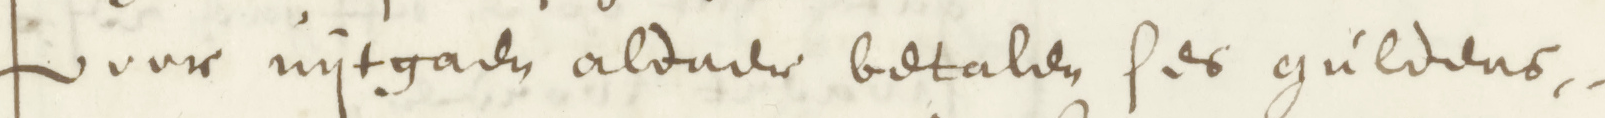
voor uijtgaen aldaer betalen ses guldens,
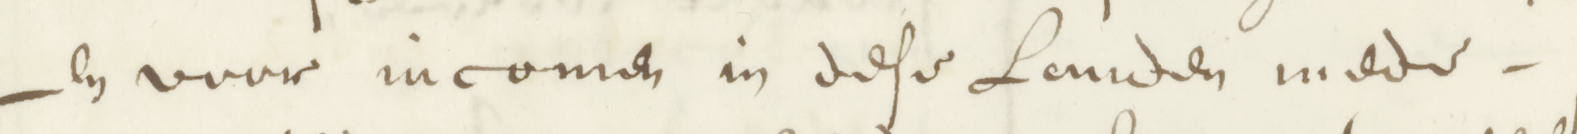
en voor incomen in dese Landen mede -
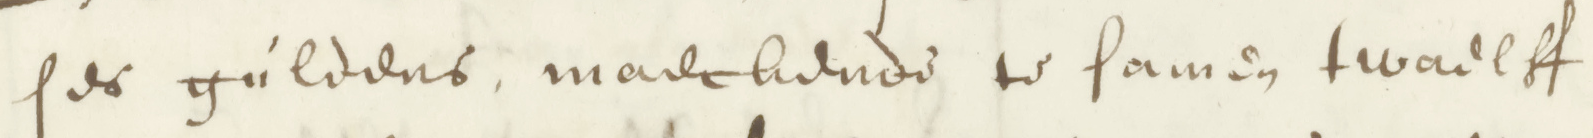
ses guldens, maeckende te samen twaelff
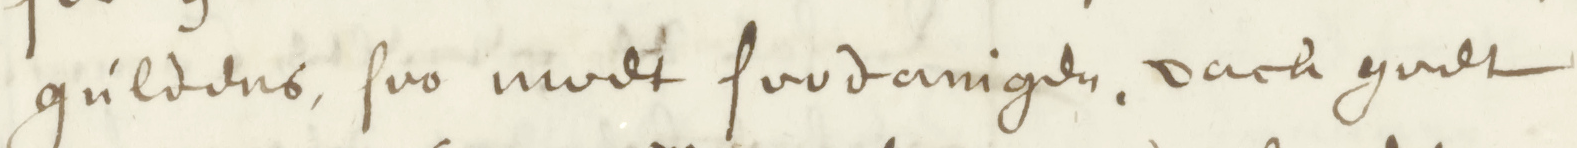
guldens, soo moet soodanigen pack goet
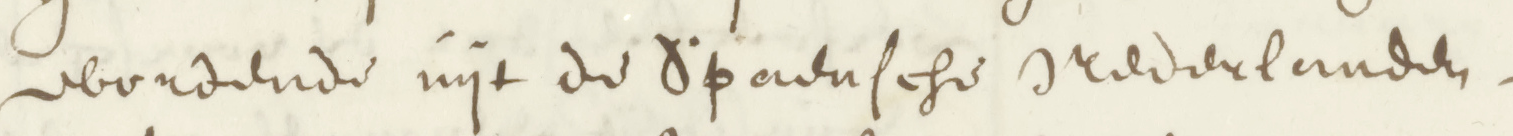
wordende uijt de Spaensche Nederlanden
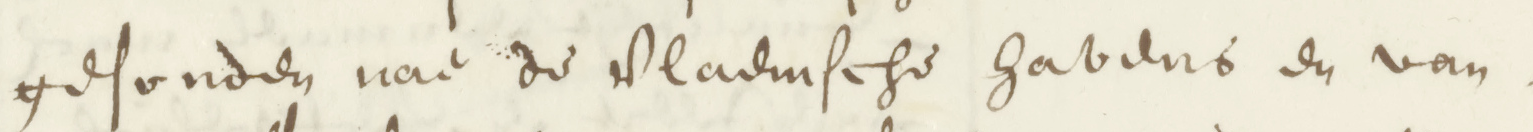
gesonden nae de Vlaemsche havens en van
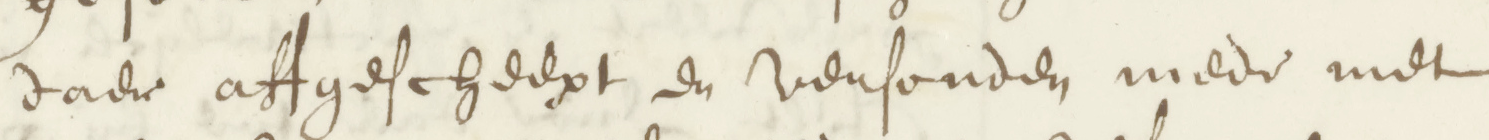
daer affgescheept en versouden mede met
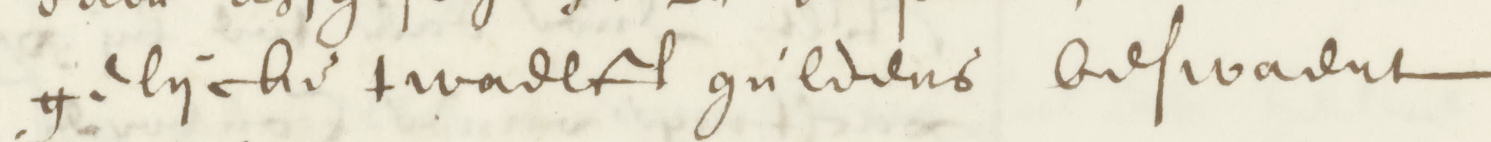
gelijcke twaelff guldens beswaert
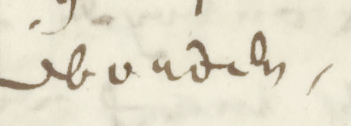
worden.
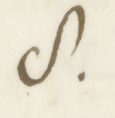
8.
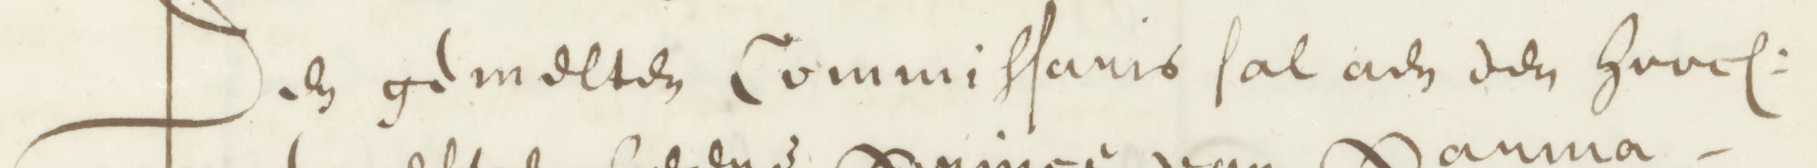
Den gemelten Commissaris sal aen den hooch=
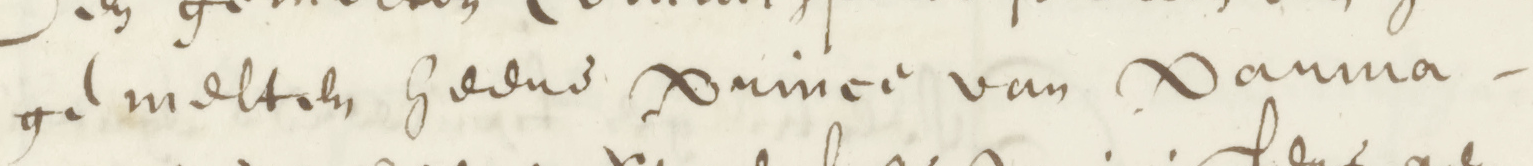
gemelten heere Prince van Parma -
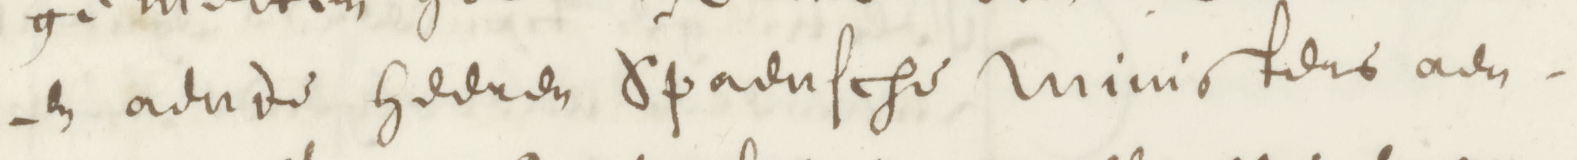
en aende heeren Spaensche Ministers aen
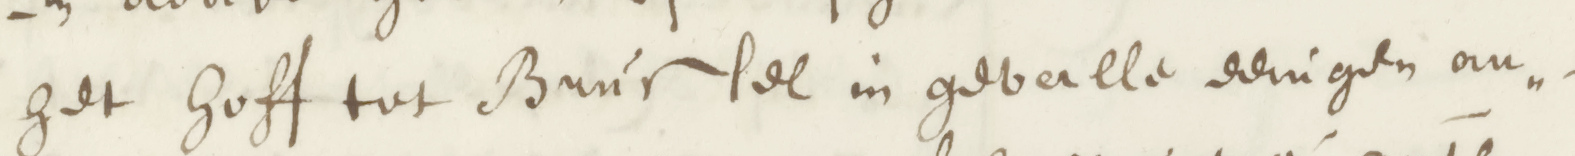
het hoff tot Brussel in gevalle eenigen an„
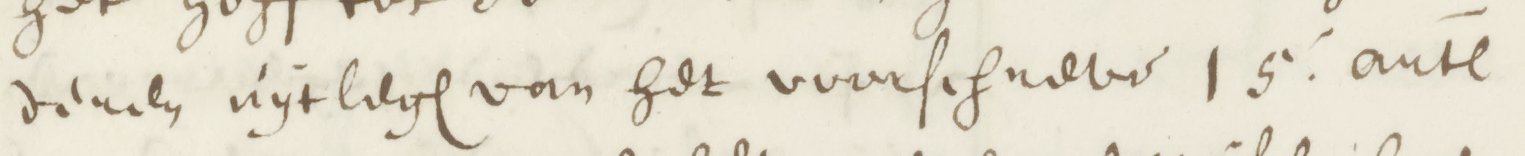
deren uijtlegh van het voorschreve 15e. artl
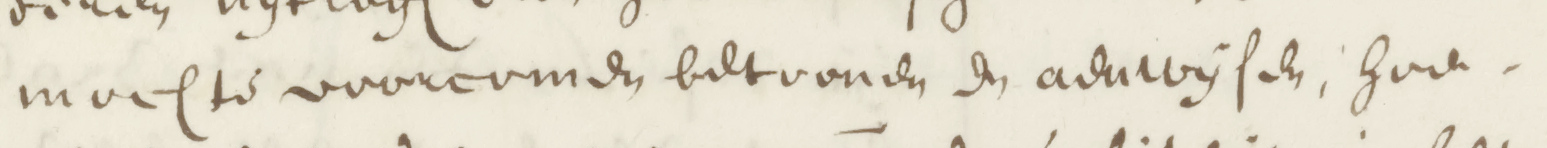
mochte voorcomen betoonen en aenwijsen, hoe
